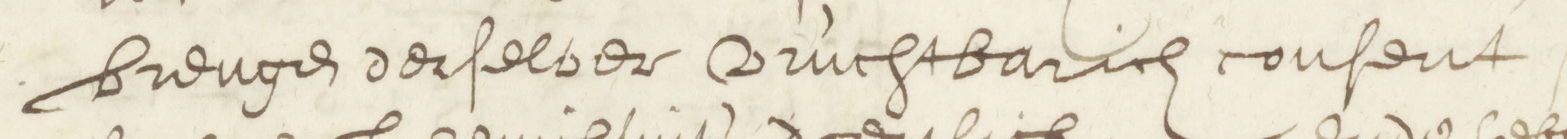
brengen derselver vruchtbarich consent
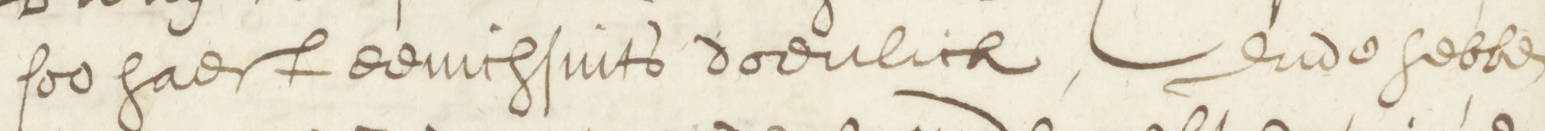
soo haest eenichsints doenlick. Ende hebben
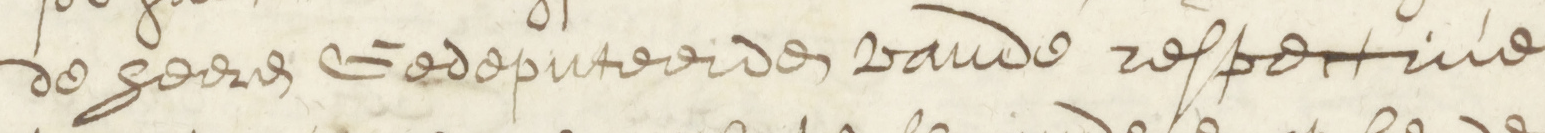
de heeren Gedeputeerden vande respectiue
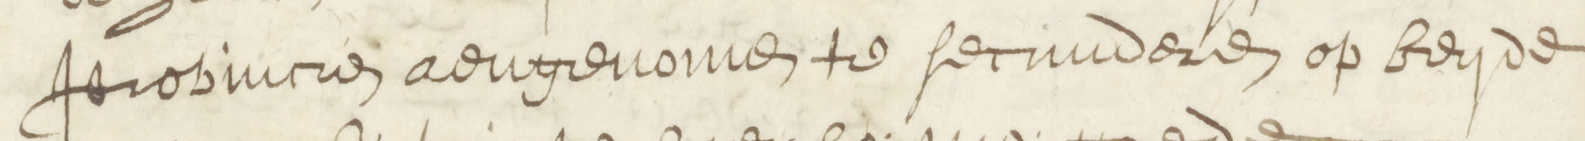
Provincien aengenomen te secunderen op beyde
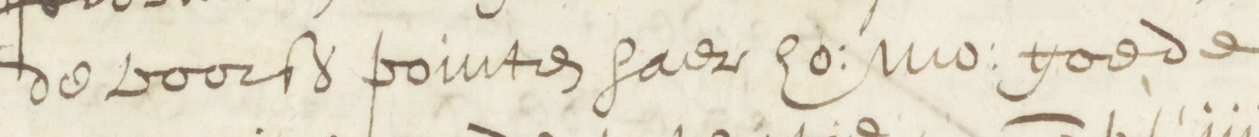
de voors pointen haer ho:Mo: goede
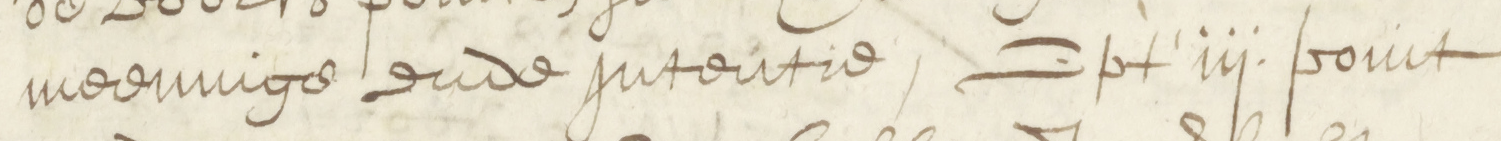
meeninge ende intentie, Opt iij. point
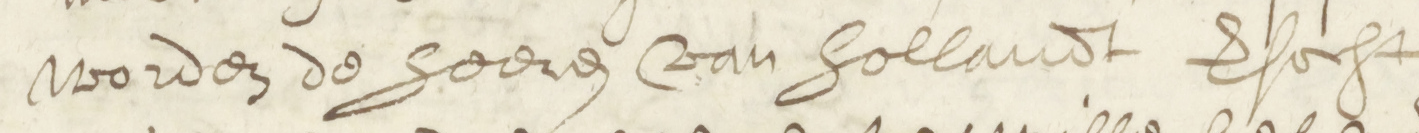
worden de heeren van Hollandt vsocht
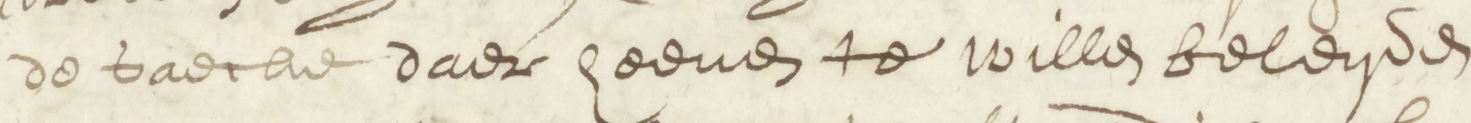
de saecke daer heenen te willen beleyden
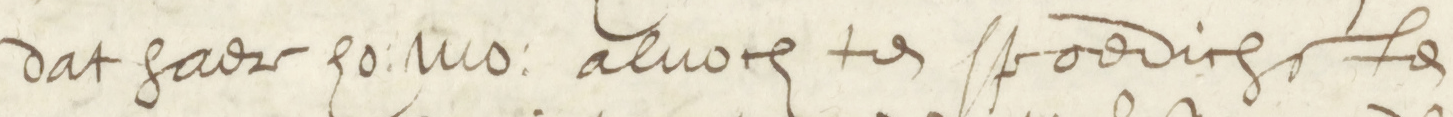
dat haer ho:Mo: alnoch ten spoedichsten
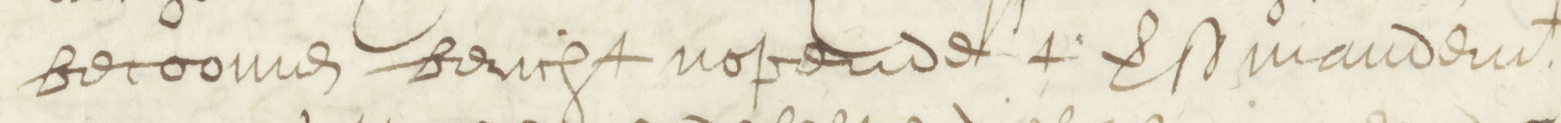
becoomen bericht nopende t' vs mandemt
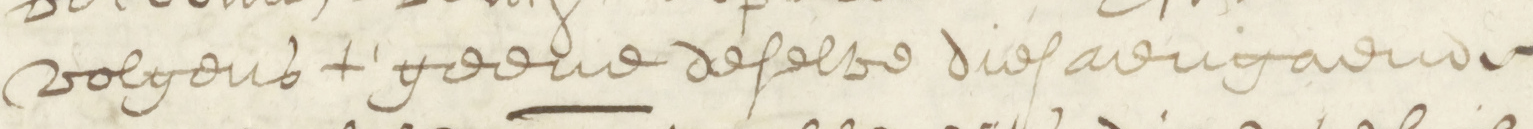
volgens t'geene deselve dies aengaende
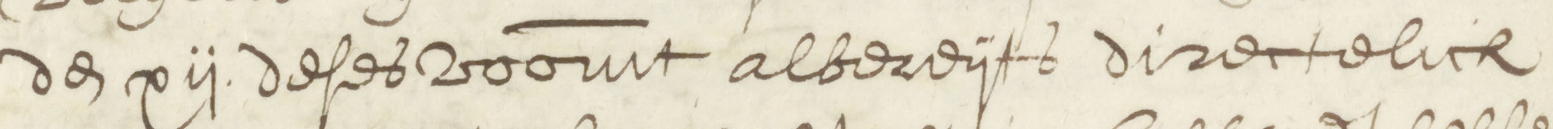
den xij deses voornt albereijts directelick
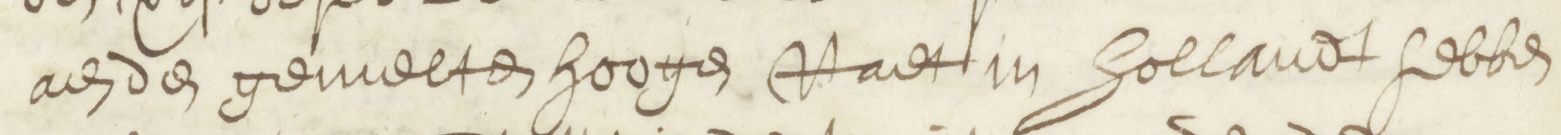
aen den gemelten hoogen Raet in Hollandt hebben
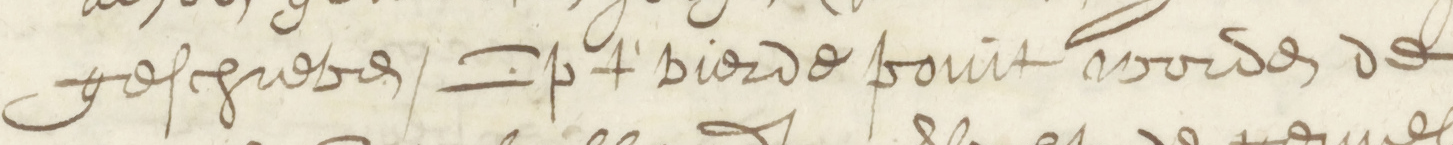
geschreven. Opt' vierde point worden de
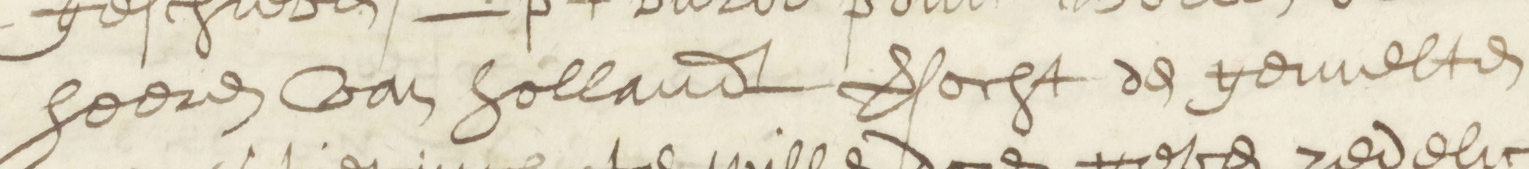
heeren van hollandt vsocht den gemelten
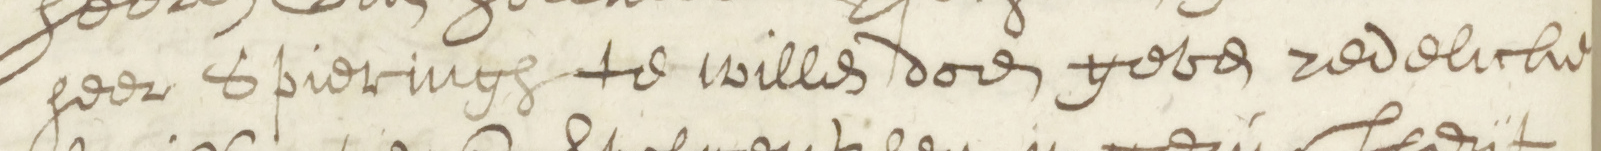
heer Spieringh te willen doen geven redelicke
